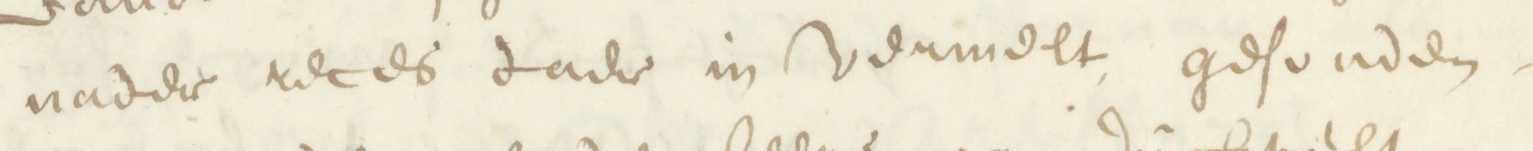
nader reces daer in vermelt, gesonden
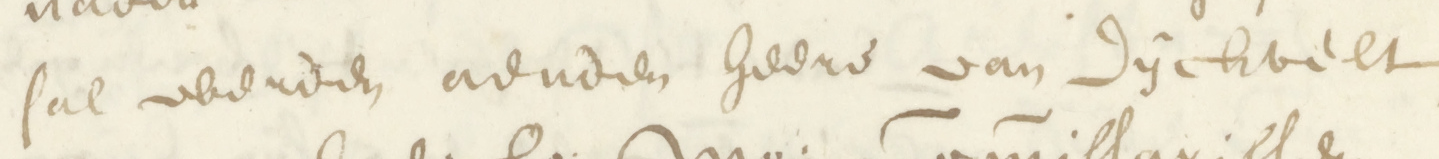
sal werden aenden heere van Dijckvelt
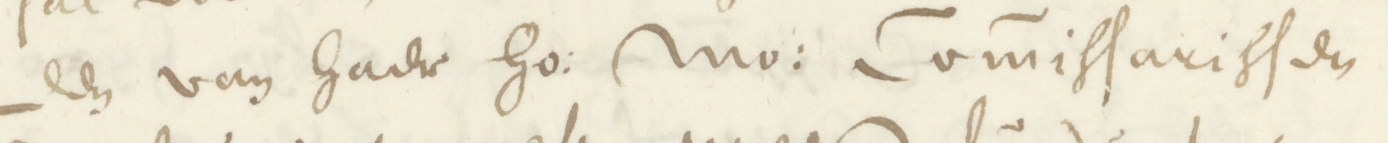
een van haer ho:mo: Commissarissen
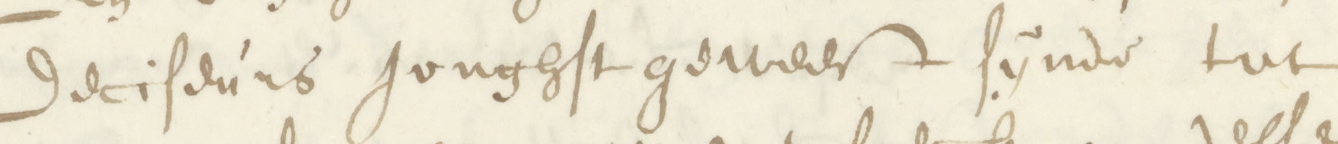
Deciseurs jonghst geweest sijnde tot
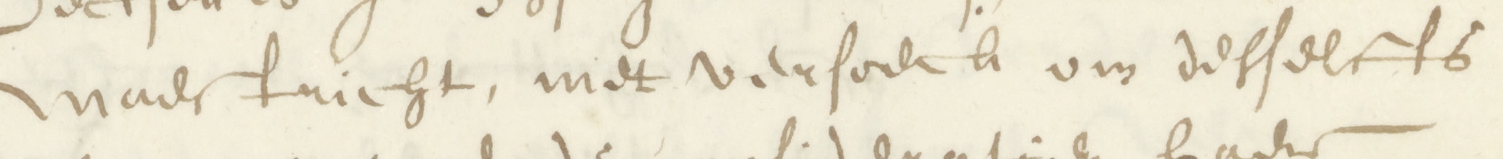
Maestricht, met versoeck om desselffs
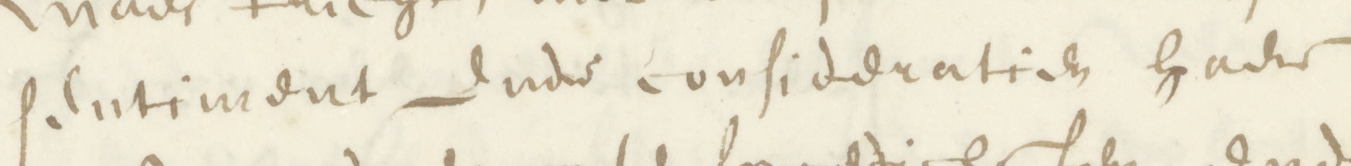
sentiment ende consideratien haer
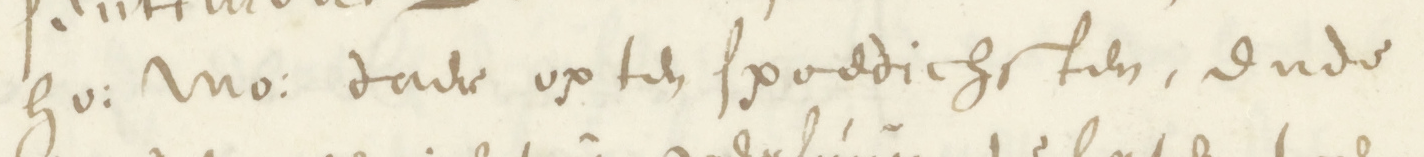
ho:Mo: daer op ten spoedichsten, ende
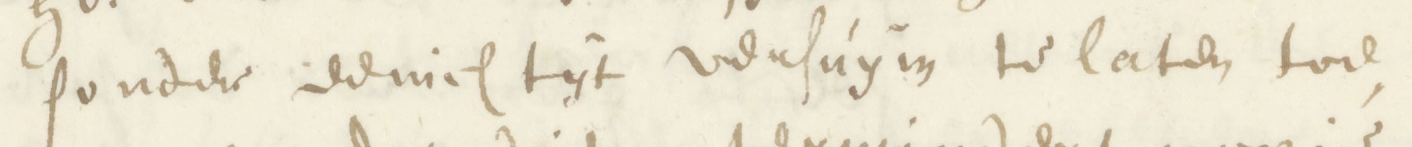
sonder eenich tijt versuijm te laten toe„
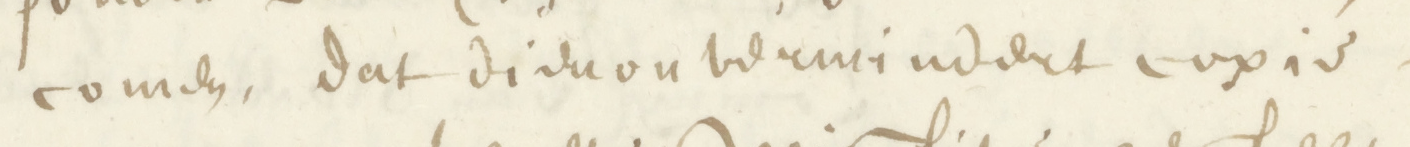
comen, dat dien onvermindert copie
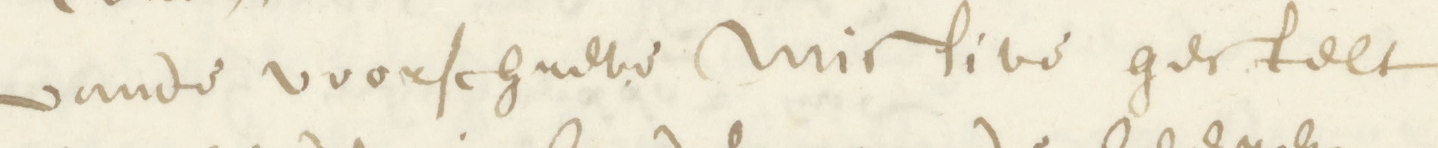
vande voorschreve Missive gestelt
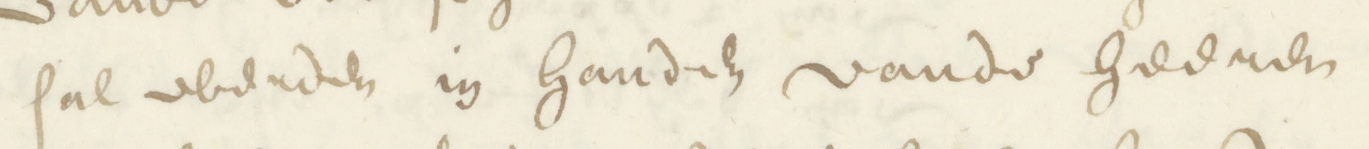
sal werden in handen vande heeren
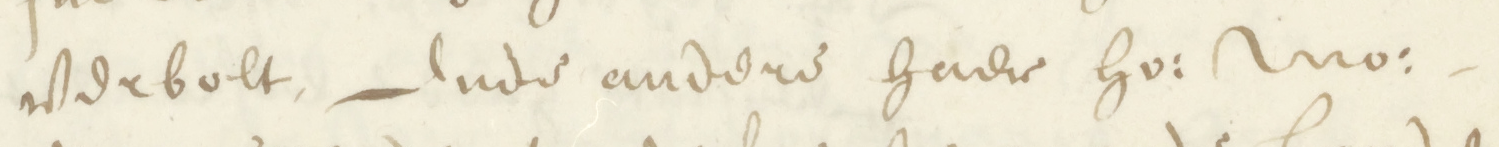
Verbolt, ende anders haer ho:Mo:
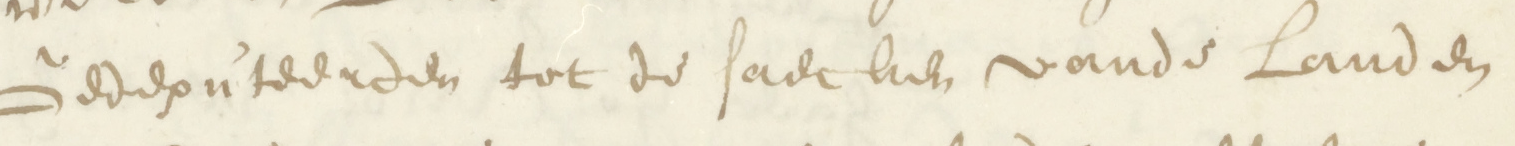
Gedeputeerden tot de saecken vande Landen
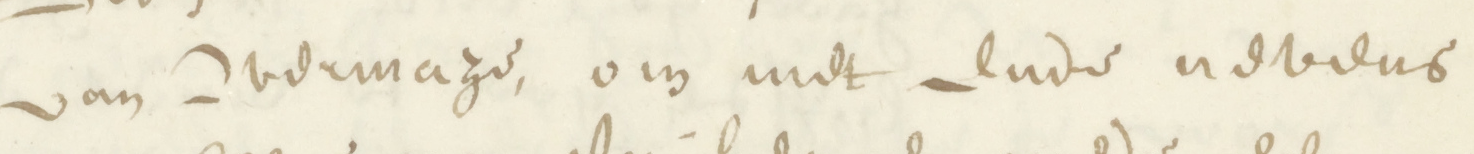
van Overmaze, om met ende nevens
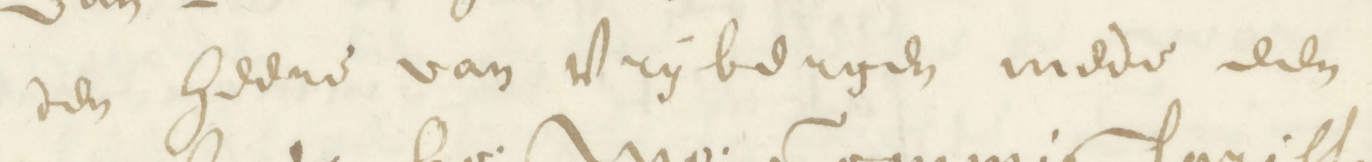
den heere van Vrijbergen mede een
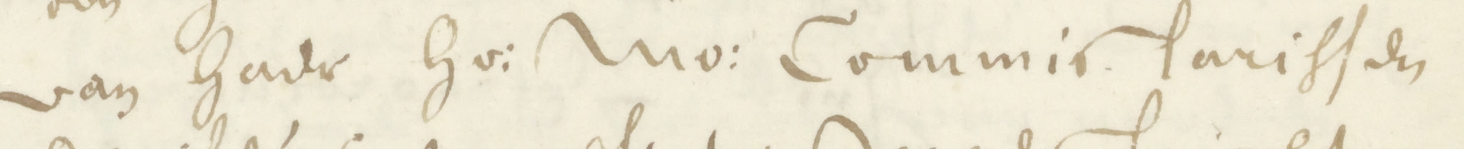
van haer ho:Mo: Commissarissen
